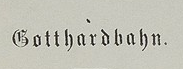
Gotthardbahn.
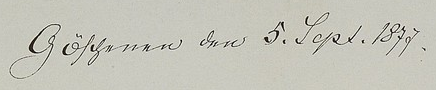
Göschenen den 5. Sept. 1877.
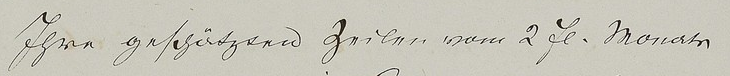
Ihre geschätzten Zeilen vom 2. fl. Monats
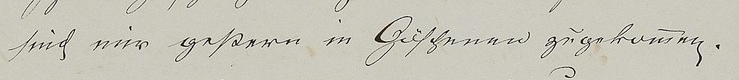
sind mir gestern in Göschenen zugekommen.
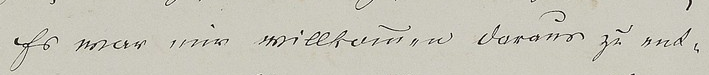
Es war mir willkommen daraus zu ent-
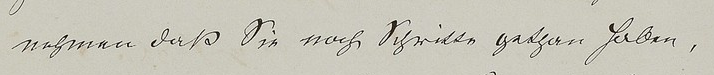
nehmen, daß Sie noch Schritte gethan haben,
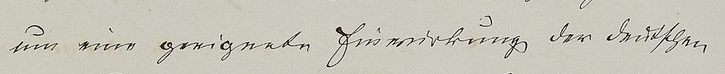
um eine geeignete Einwirkung der deutschen
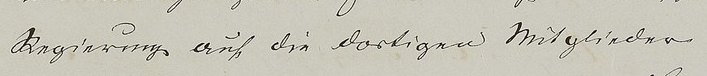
Regierung auf die dortigen Mitglieder
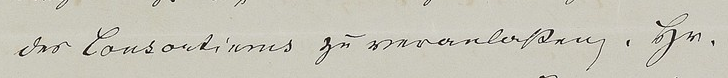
des Consortiums zu veranlaßen. Hr.
